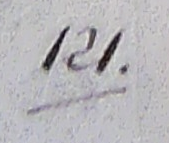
121.
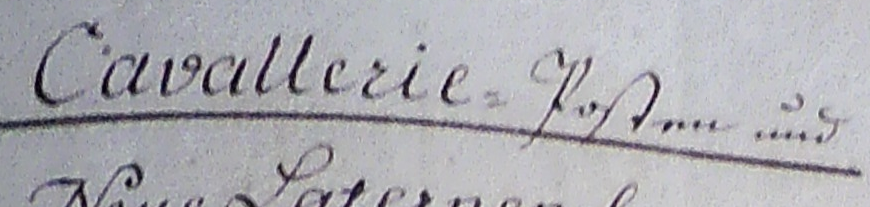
Cavallerie Posten und
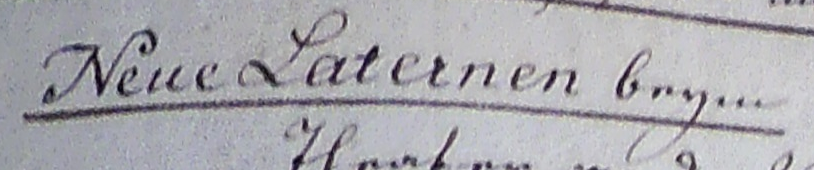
Neue Laternen beym
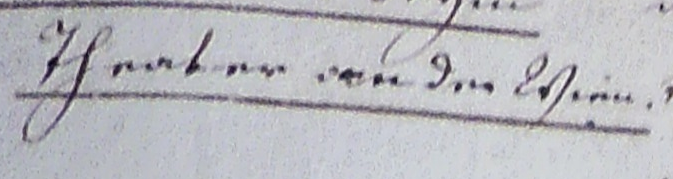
Theater an den Wien.
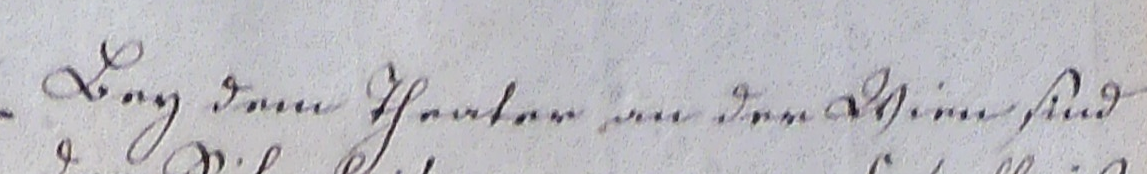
Bey dem Theater an der Wien sind
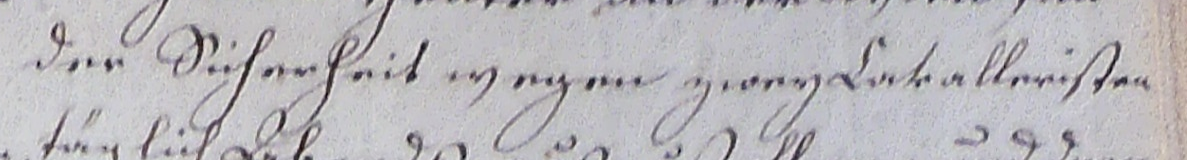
der Sicherheit wegen zwey Cavalleristen
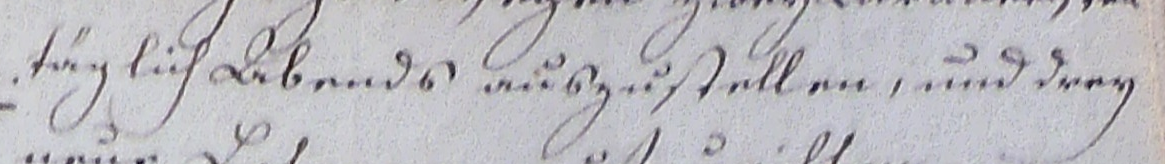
täglich Abends auszustellen, und drey
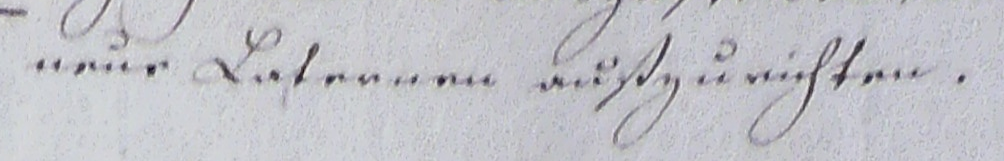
neue Laternen aufzurichten.
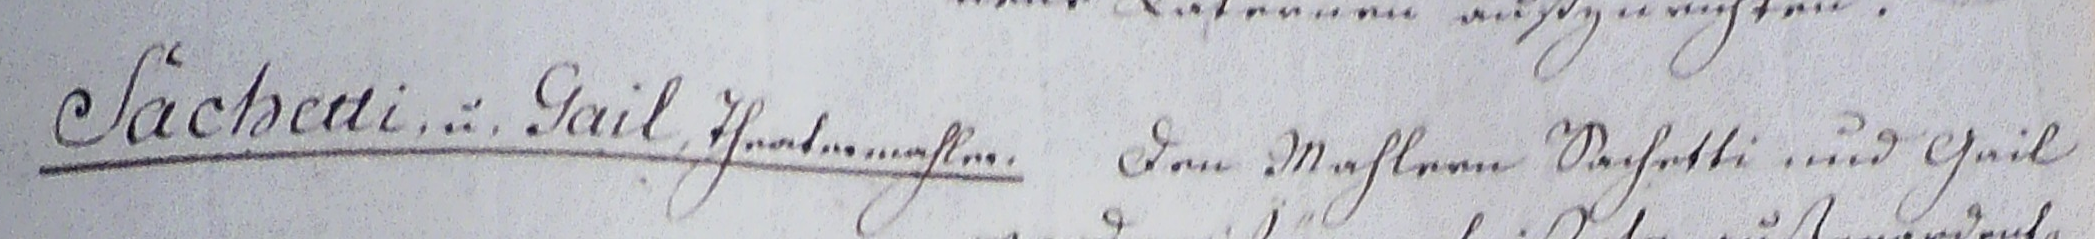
Sachetti, u. Gail, Theatermahler. Den Mahlern Sachetti und Gail
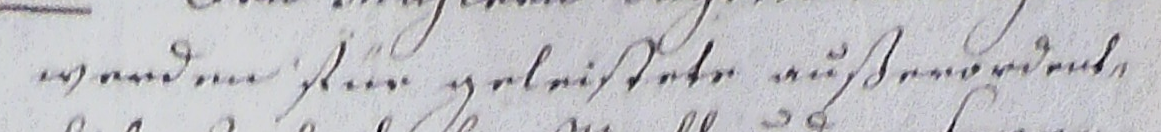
werden für geleistete außerordent¬
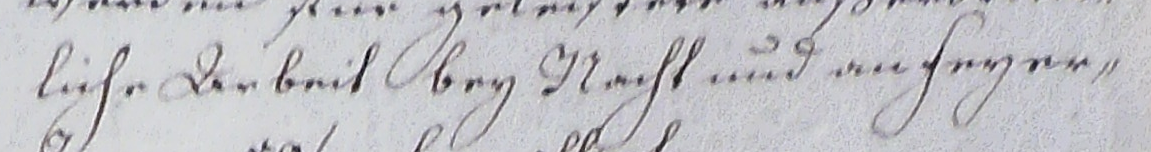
liche Arbeit bey Nacht und an Feyer¬
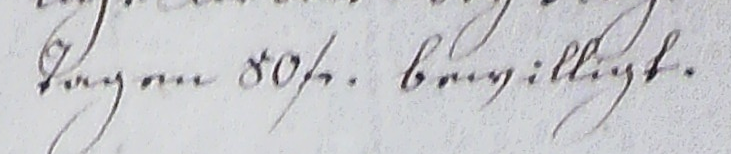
Tagen 80fr. bewilligt.
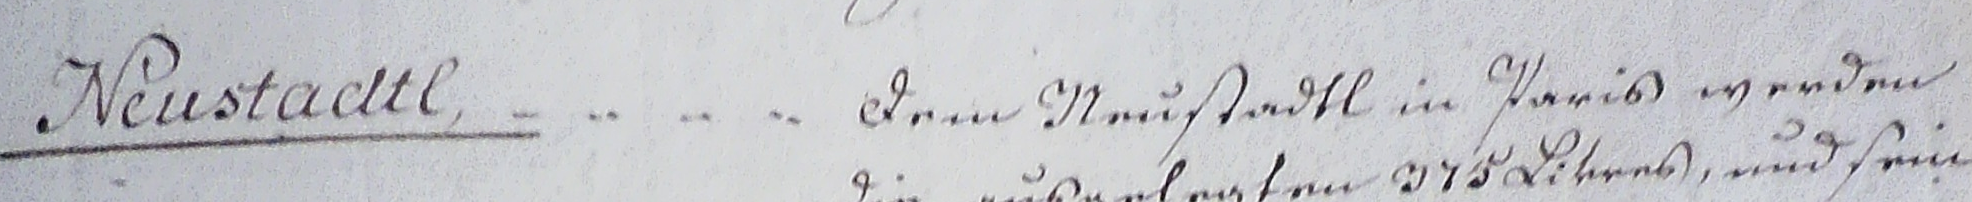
Neustadtl .. .. .. Dem Neustadtl in Paris werden
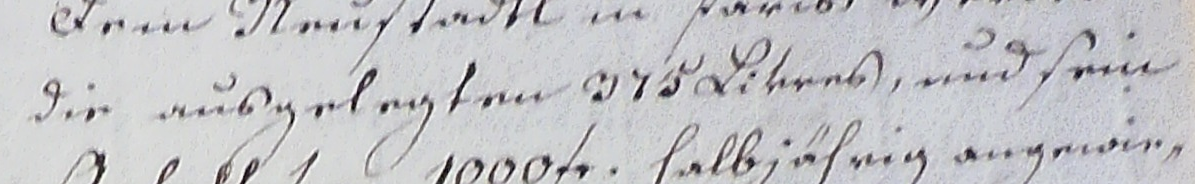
die ausgelegten 375 Livres, und sein
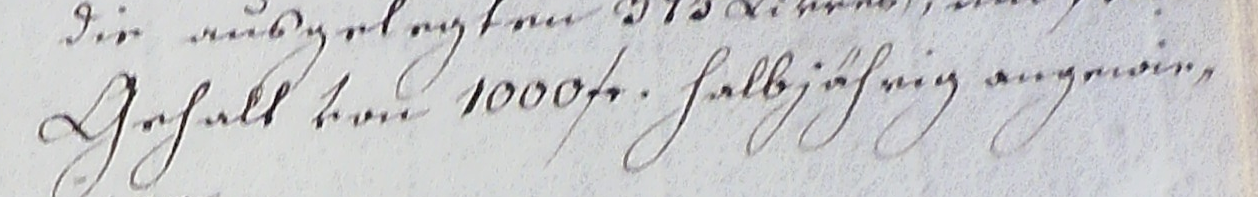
Gehalt von 1000fr. halbjährig angewie¬
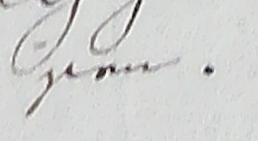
sen.
